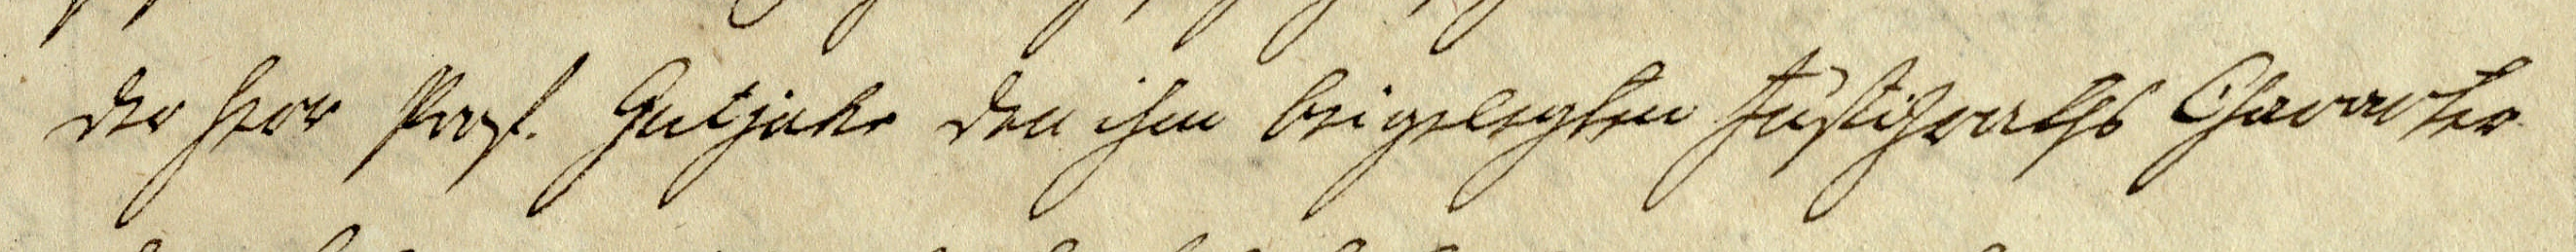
der Herr Prof. Gutjahr den ihm beigelegten Justizraths Character
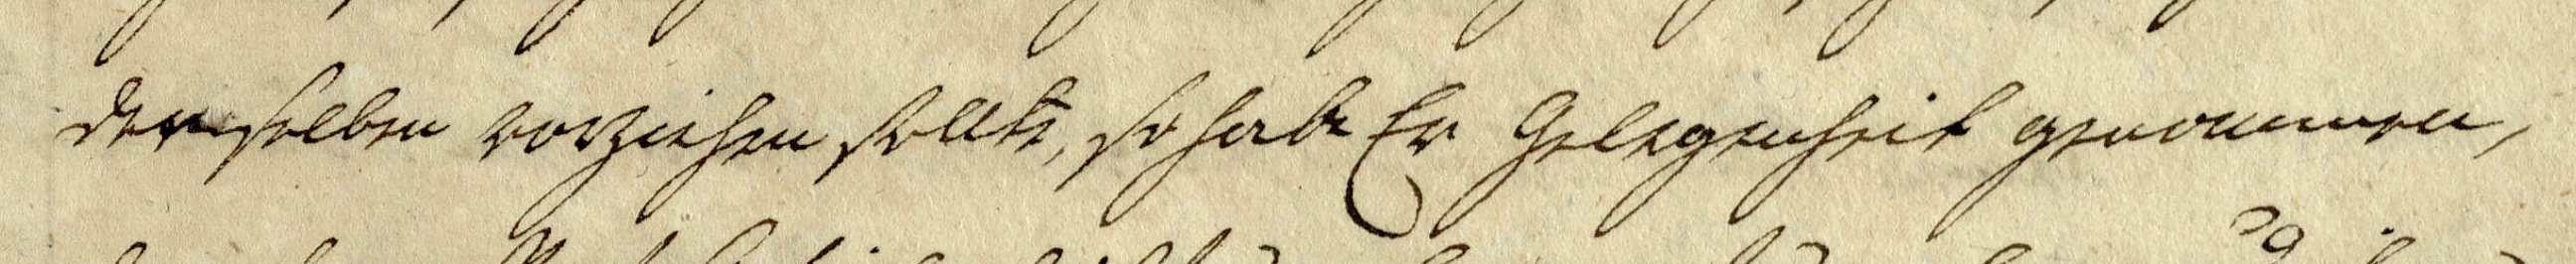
derselben vorziehen sollte, so habe Er Gelegenheit genommen,
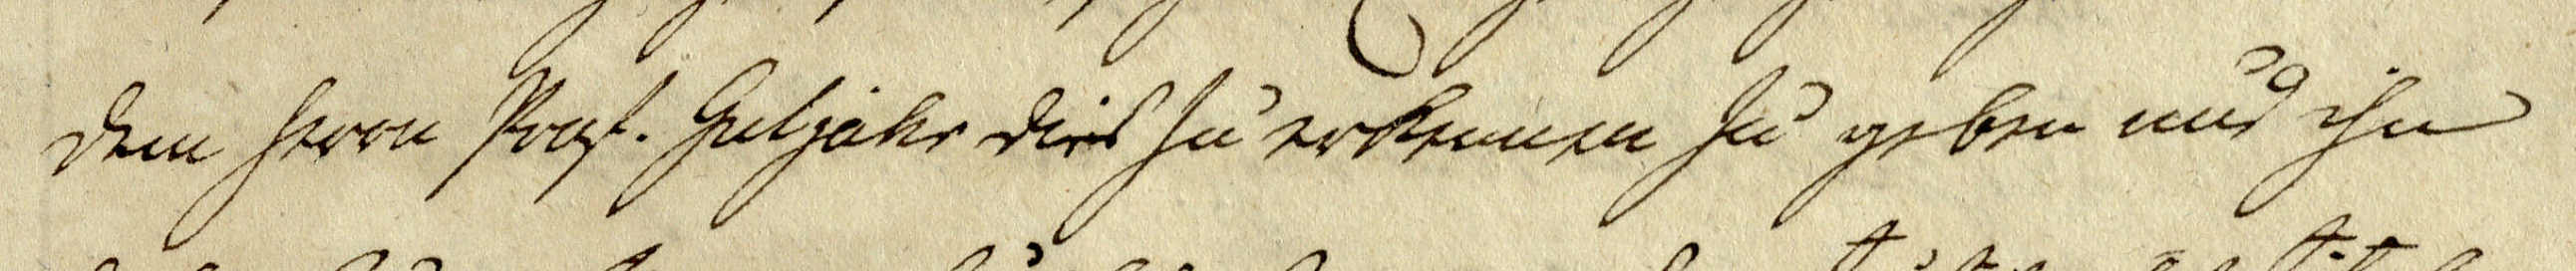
dem Herrn Prof. Gutjahr dies zu erkennen zu geben und ihn
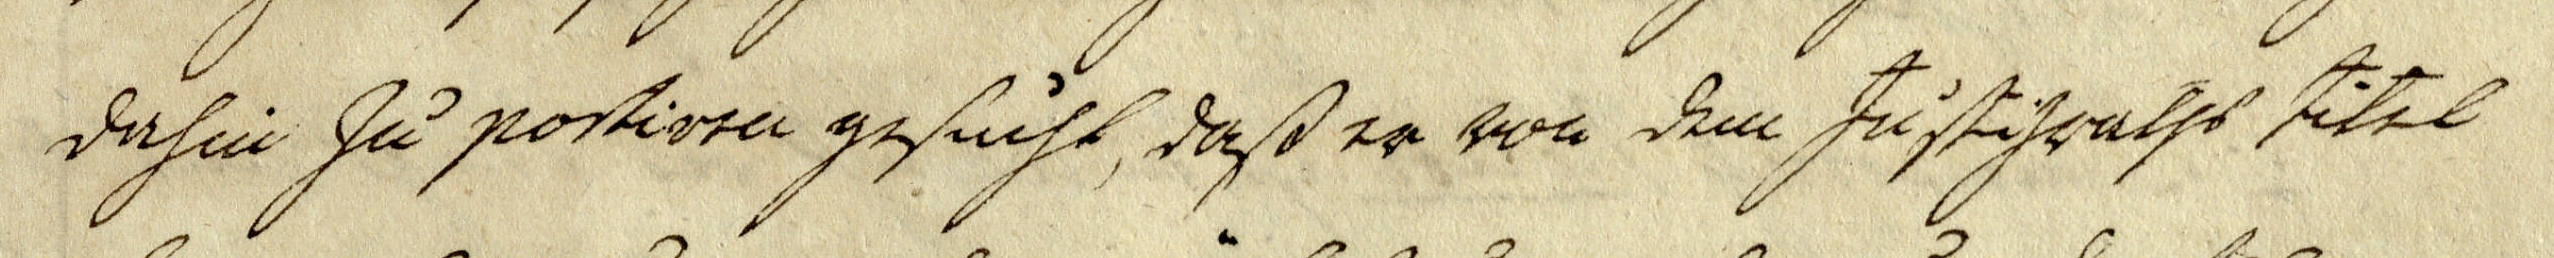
dahin zu portiren gesucht, daß er von dem Justizraths Titel
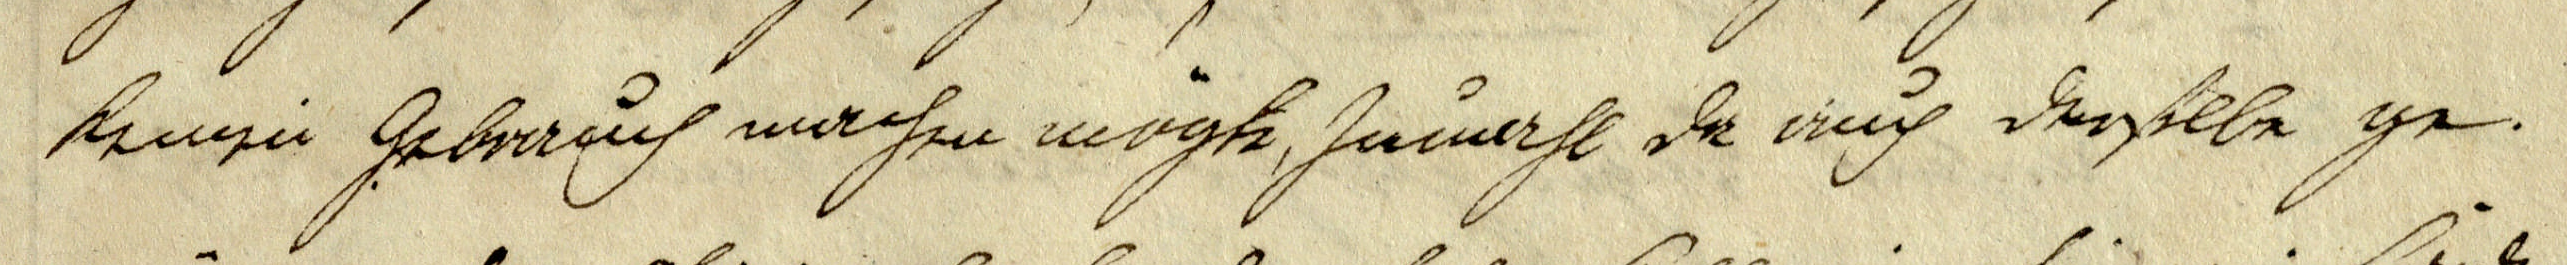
keinen Gebrauch machen mögte, zumahl da auch derselbe ge¬
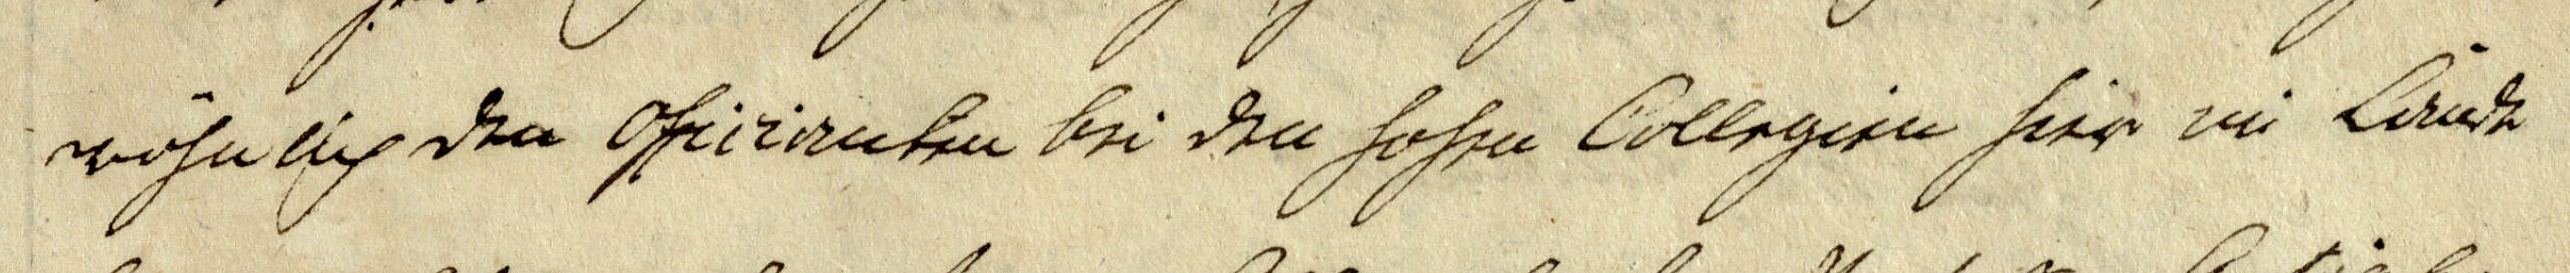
wöhnlich den Officianten bei den hohen Collegien hier im Lande
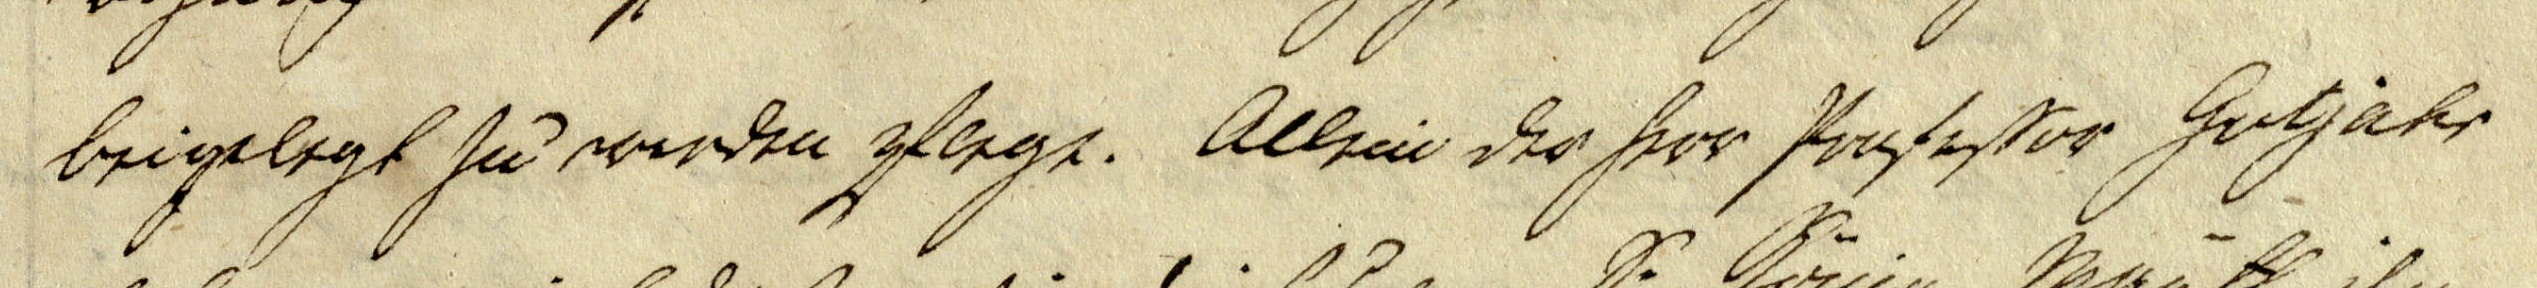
beigelegt zu werden pflege. Allein der Herr Professor Gutjahr
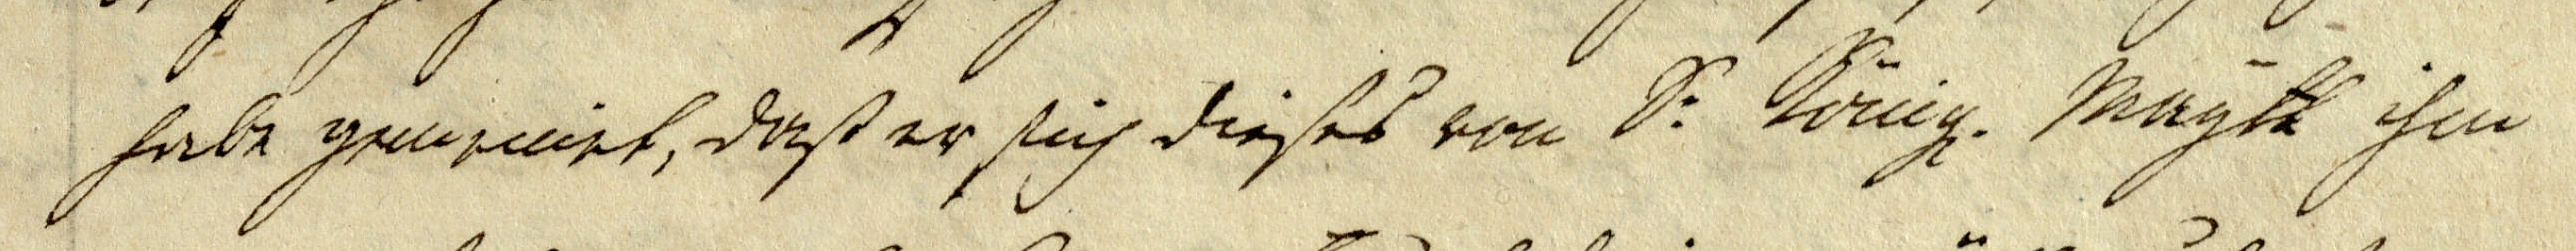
habe gemeinet, daß er sich dieses von Sr. König. Maÿtt ihm
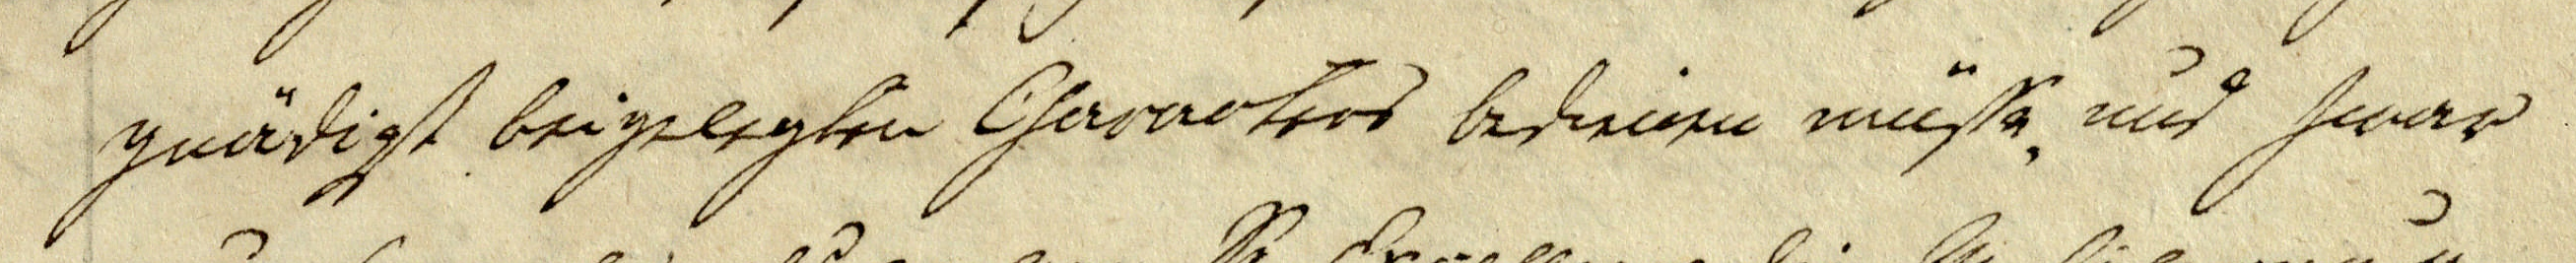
gnädigst beigelegten Charackters bedienen müsse, und zwar
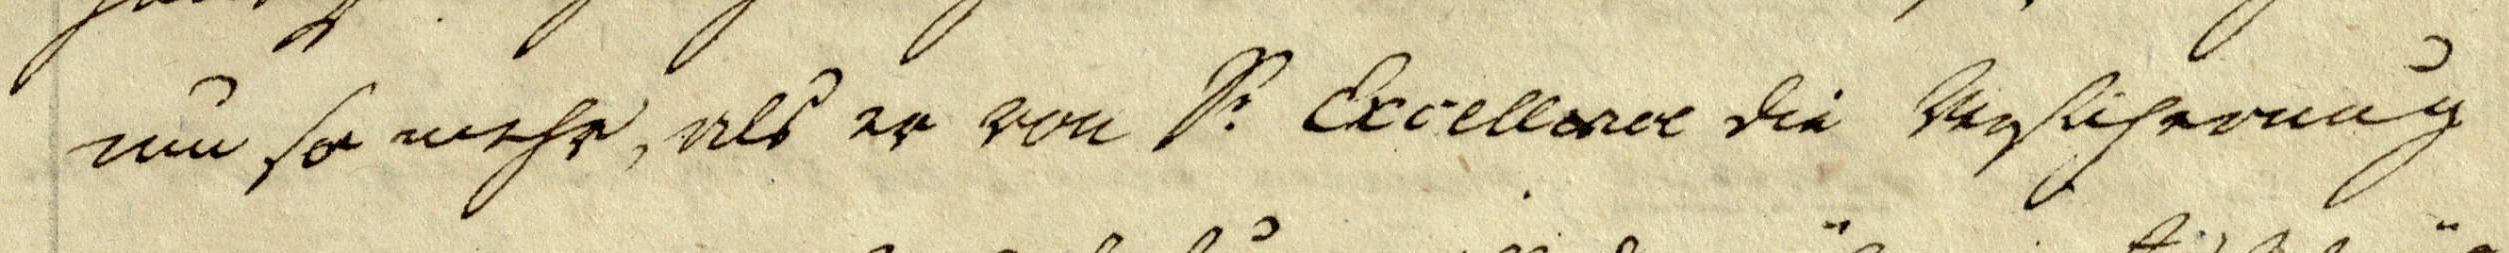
um so mehr, als er von Sr Excellence die Versicherung
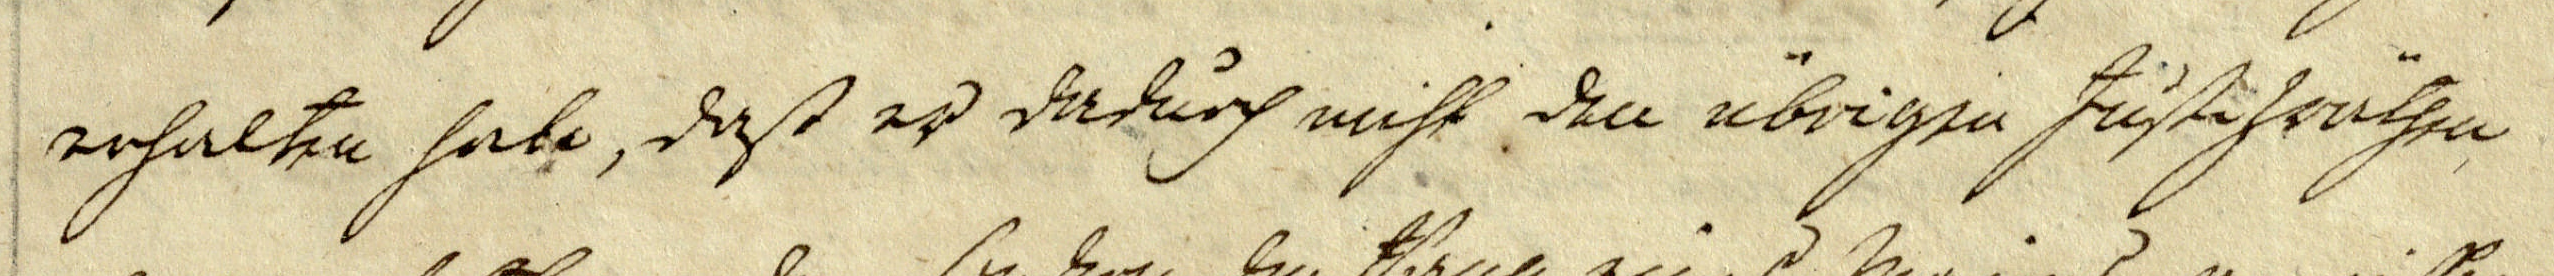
erhalten habe, daß er dadurch nicht den übrigen Justizräthen
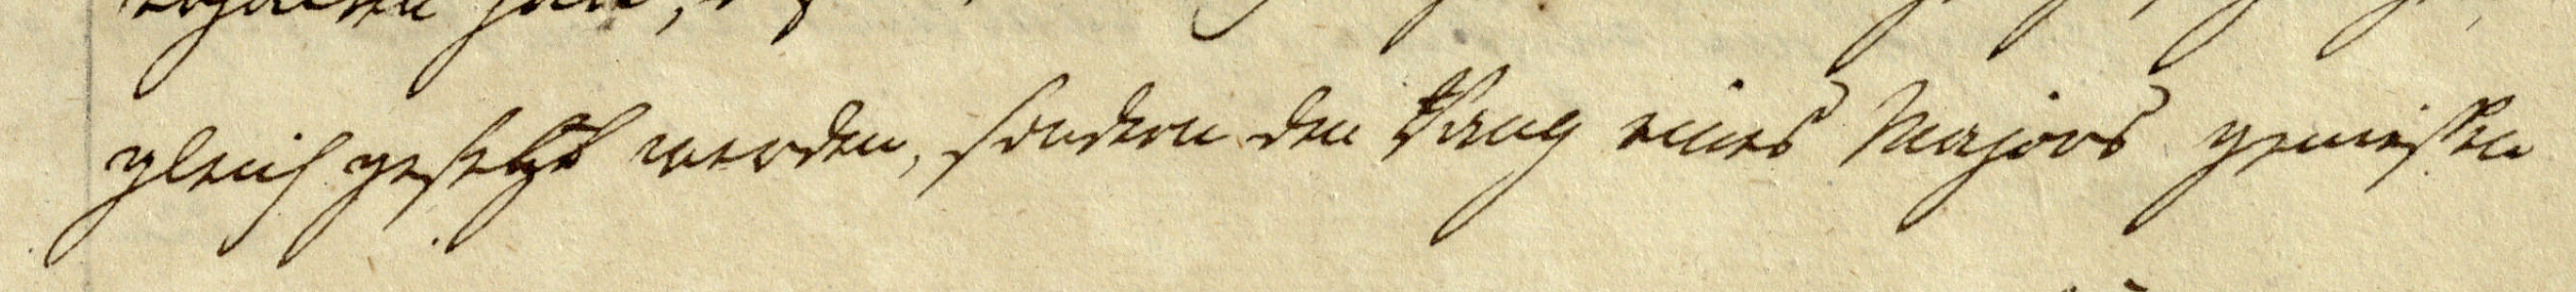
gleichgesetzt werden, sondern den Rang eines Majors geniessen
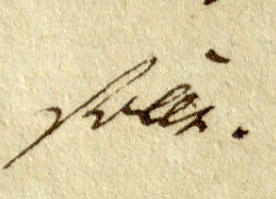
solle.
